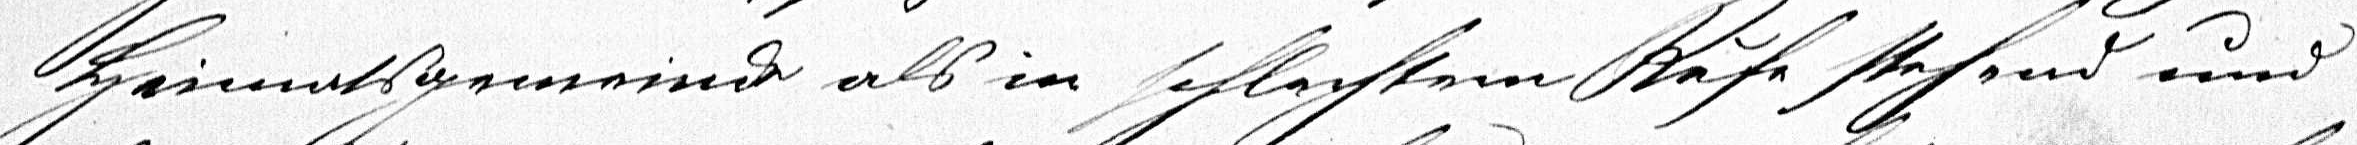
Heimatsgemeinde als in schlechtem Rufe stehend und
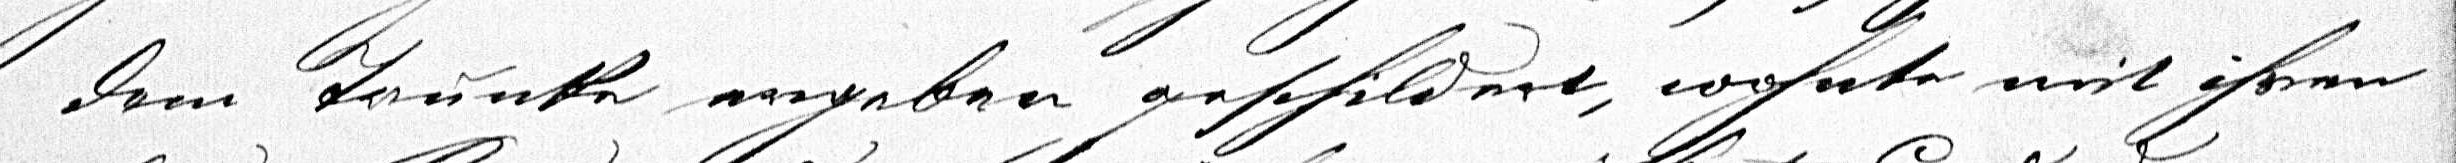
dem Trunke ergeben geschildert, wohnte mit ihrem
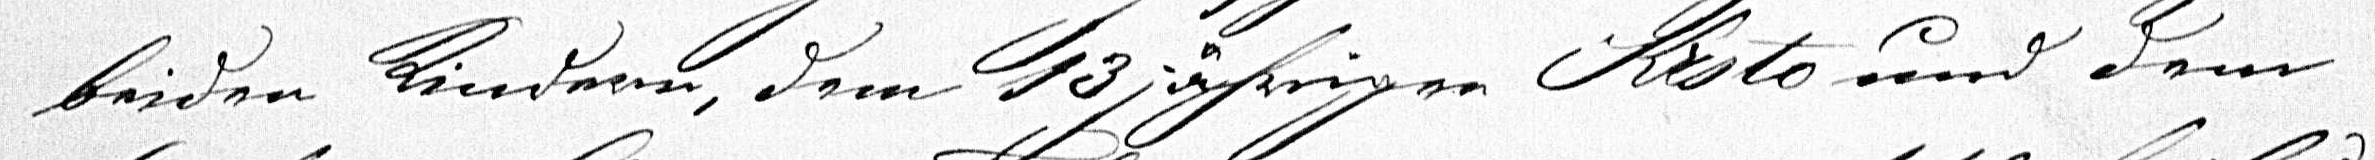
beiden Kindern, dem 13 jährigen Kisto und dem
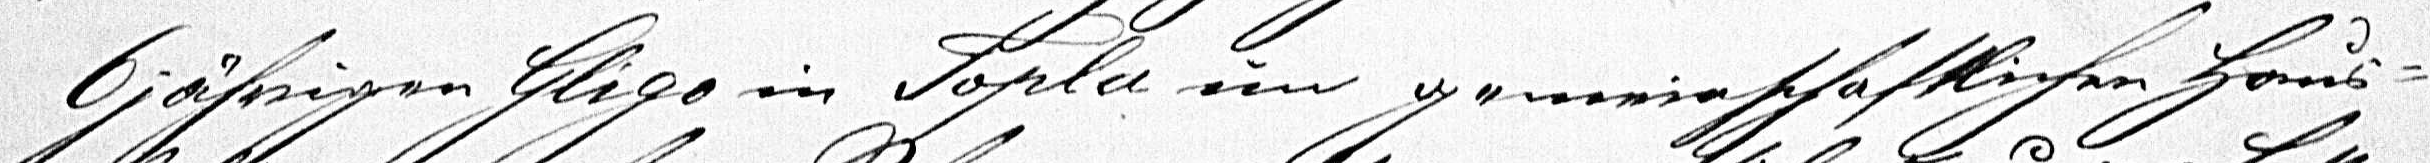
6jährigen Gligo in Topla im gemeinschaftlichen Haus¬
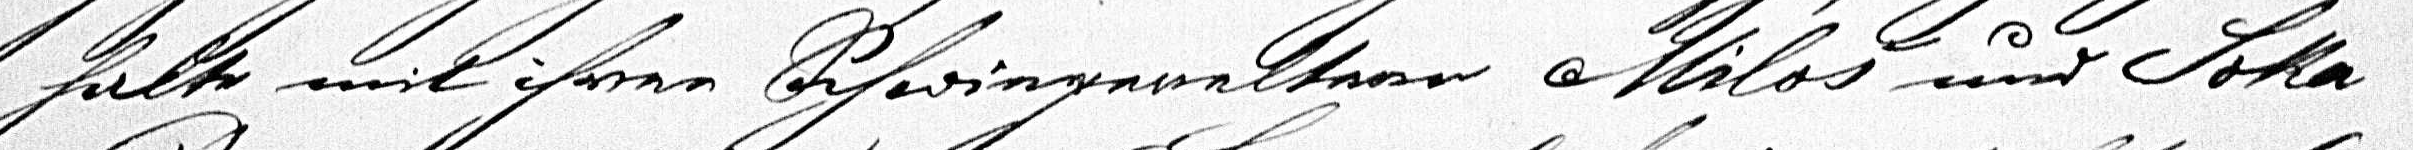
halt mit ihrem Schwiegereltern Milos und Soka
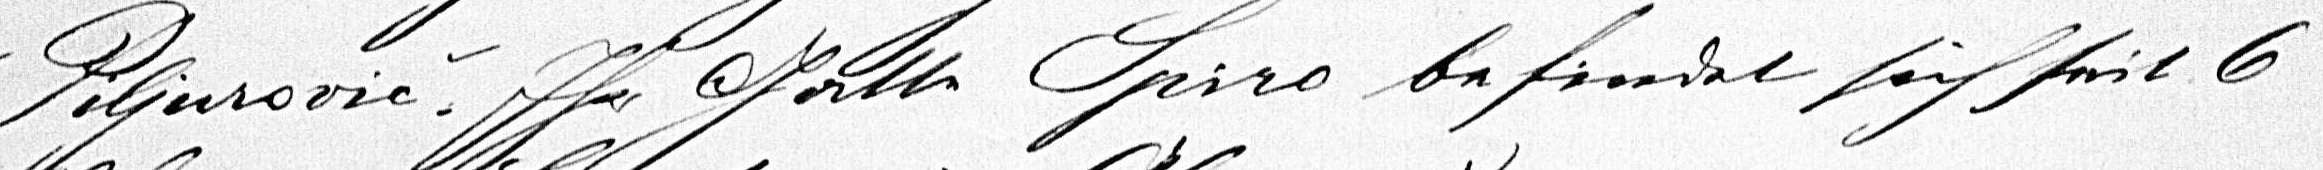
Piljurović. Ihr Gatte Spiro befindet sich seit 6
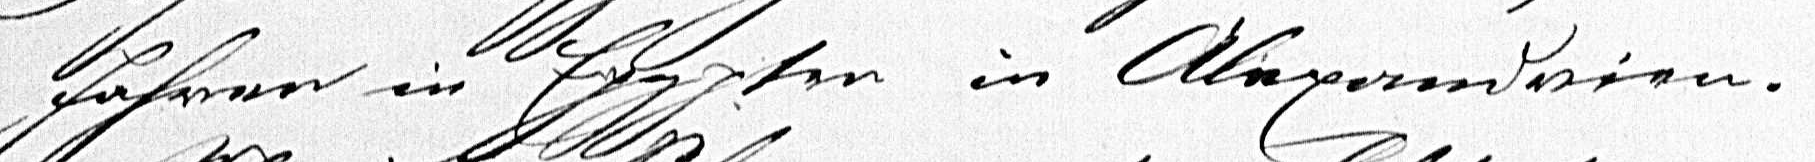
Jahren in Egypten in Alexandrien.
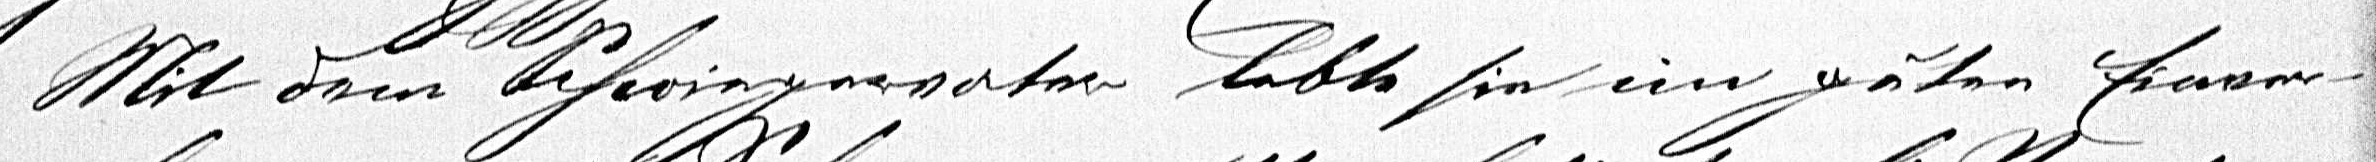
Mit dem Schwiegervater lebte sie im guten Einvern¬
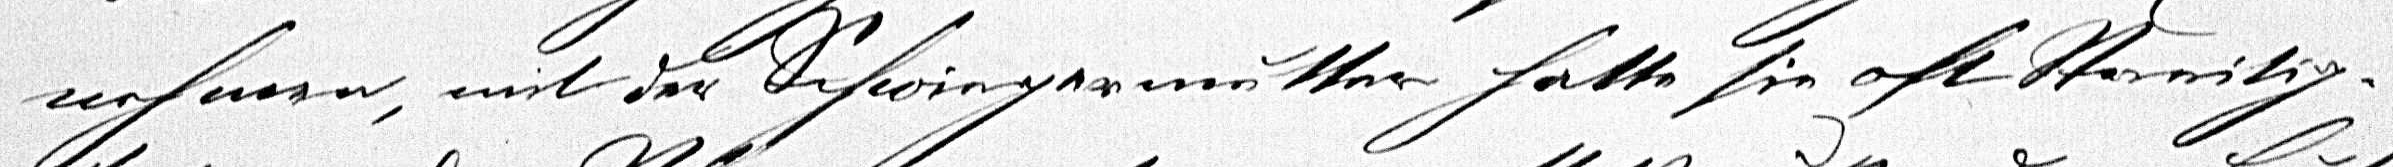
ehmen, mit der Schiwegermutter hatte sie oft Streitig¬
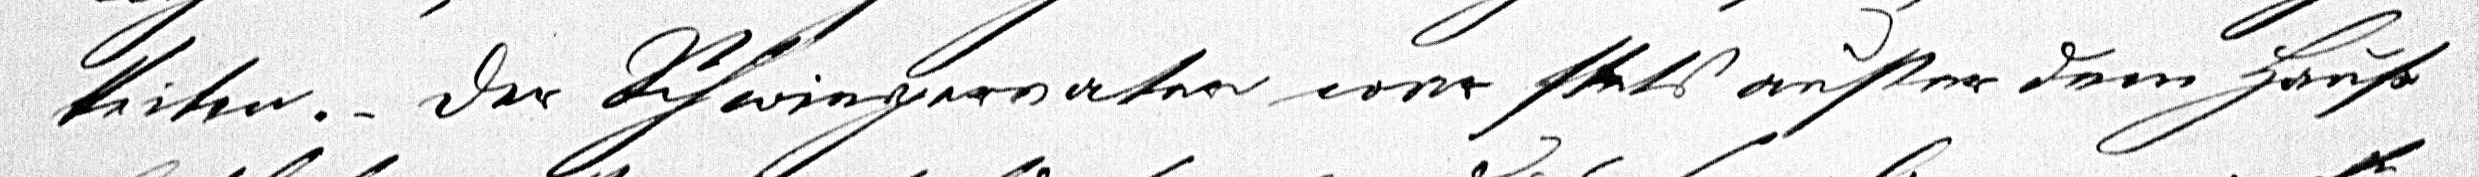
keiten. Der Schwiegervater war stets außer dem Hause
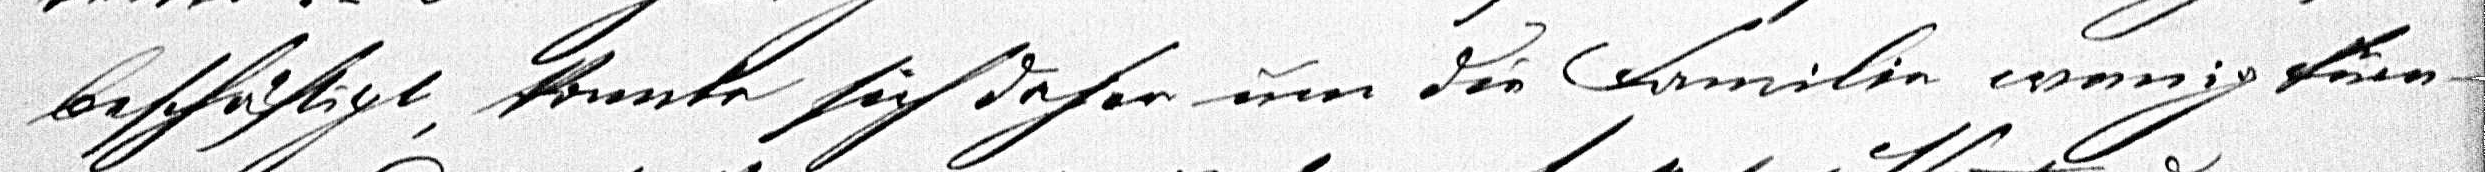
beschäftigt, konnte sich daher um die Familie wenig küm¬
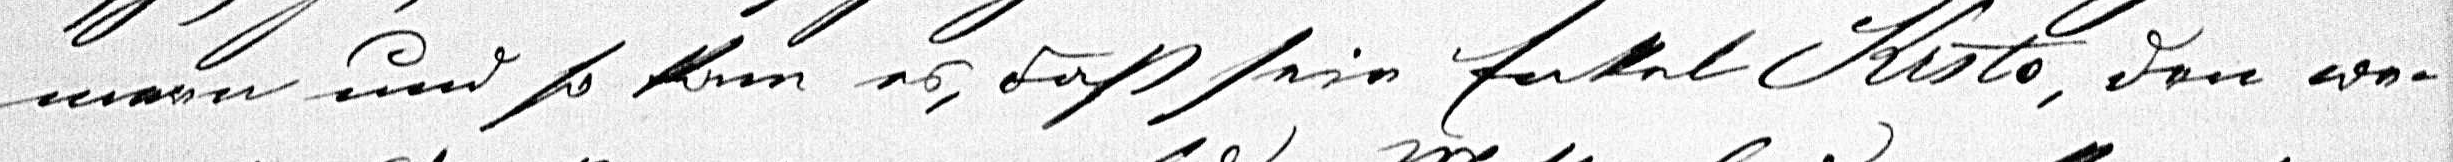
mern und so kam es, daß sein Enkel Kisto, den we¬
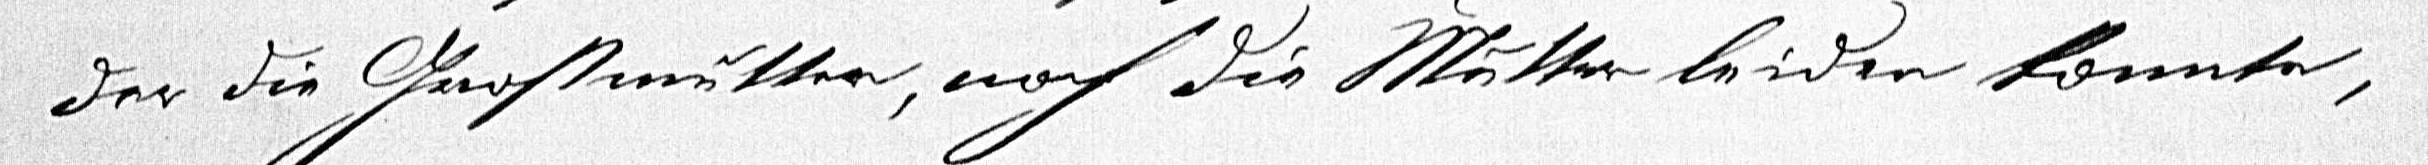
der die Großmutter, noch die Mutter leiden konnte
